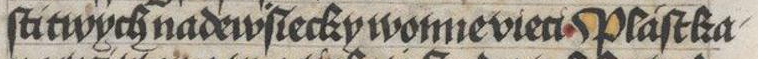ſṫí twych nadewẛiecky wonnie vieci.Pláſtka¬
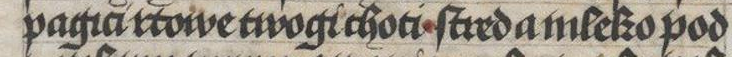pagicí rtowe twogi choti.ſtred a maleko pod
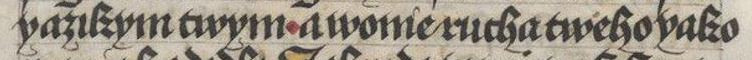yazikym twym.a vonie rucha tweho yako
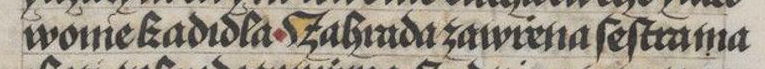wonie kadidla.Zahrada zawṙena ſeſtrama
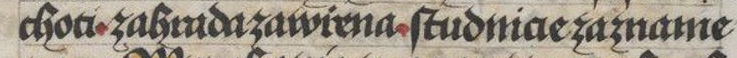choti.zahrada zawṙena.ſtudnicie za zname¬
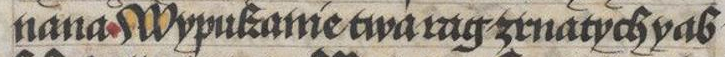nana.Wypukaníe twa rag zrnatých yab¬
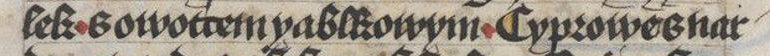lek.s owotcem yablkowym.Cyprowes nar¬
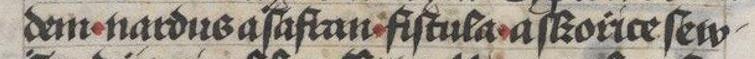dem.nardus a ẛafran:fiſtula.a ſkoṙice ſew¬
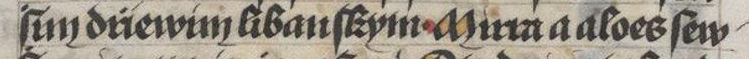ẛím dṙíewím libanſkym.Mirra a aloes ſew¬
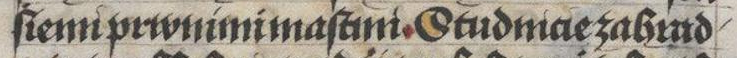ẛíemi prwními maſtmi.Studnicie zahrad¬
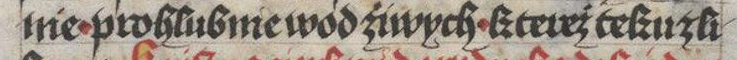nie.prohlubnie wod žiwych.ktereż teku zli¬
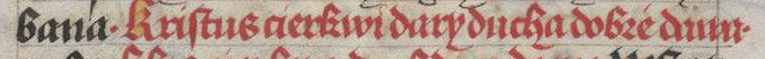bana.Kriſtus cierkwi dary ducha dobré dawa.
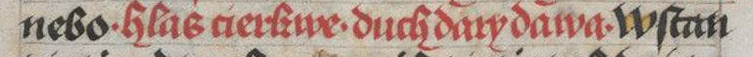nebo.hlas cierkwe.duch dary dawa.Wſtan
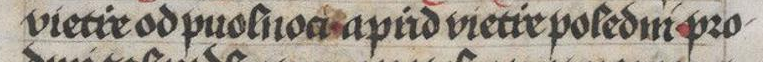vietṙe od puolnoci.a pṙid vietṙe polední pro¬
